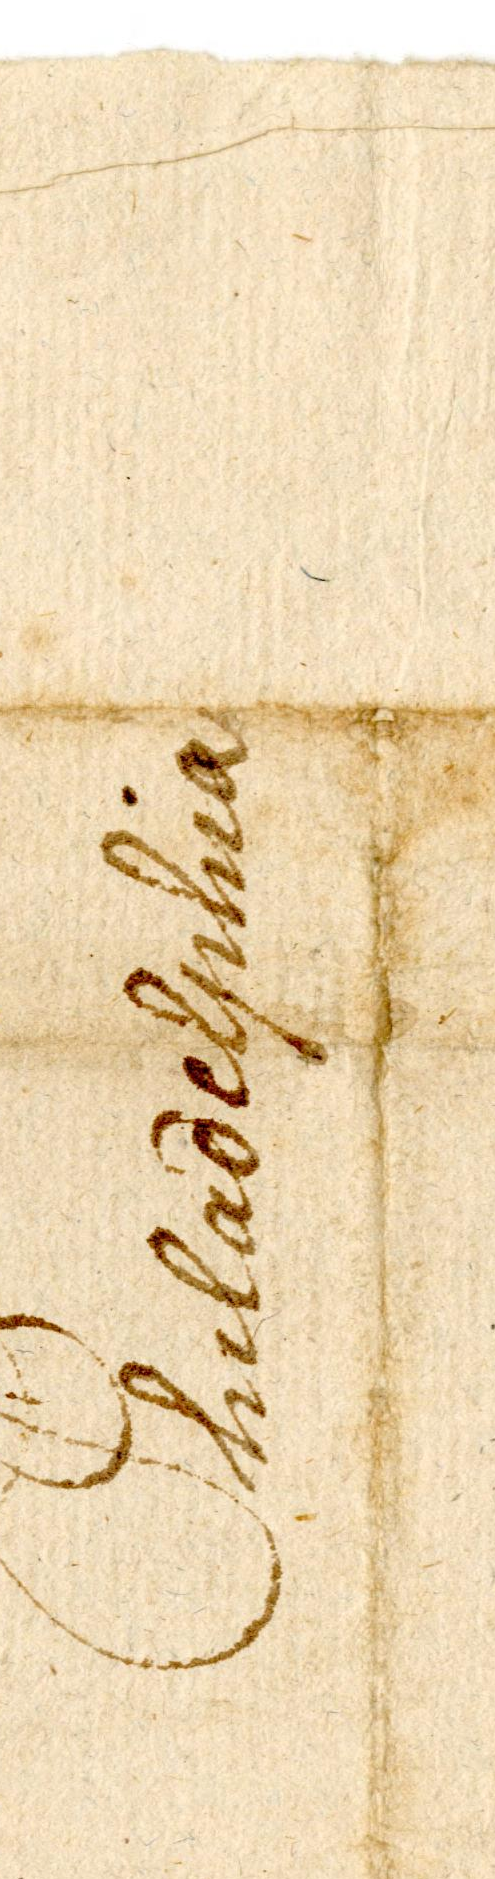Philadelphia
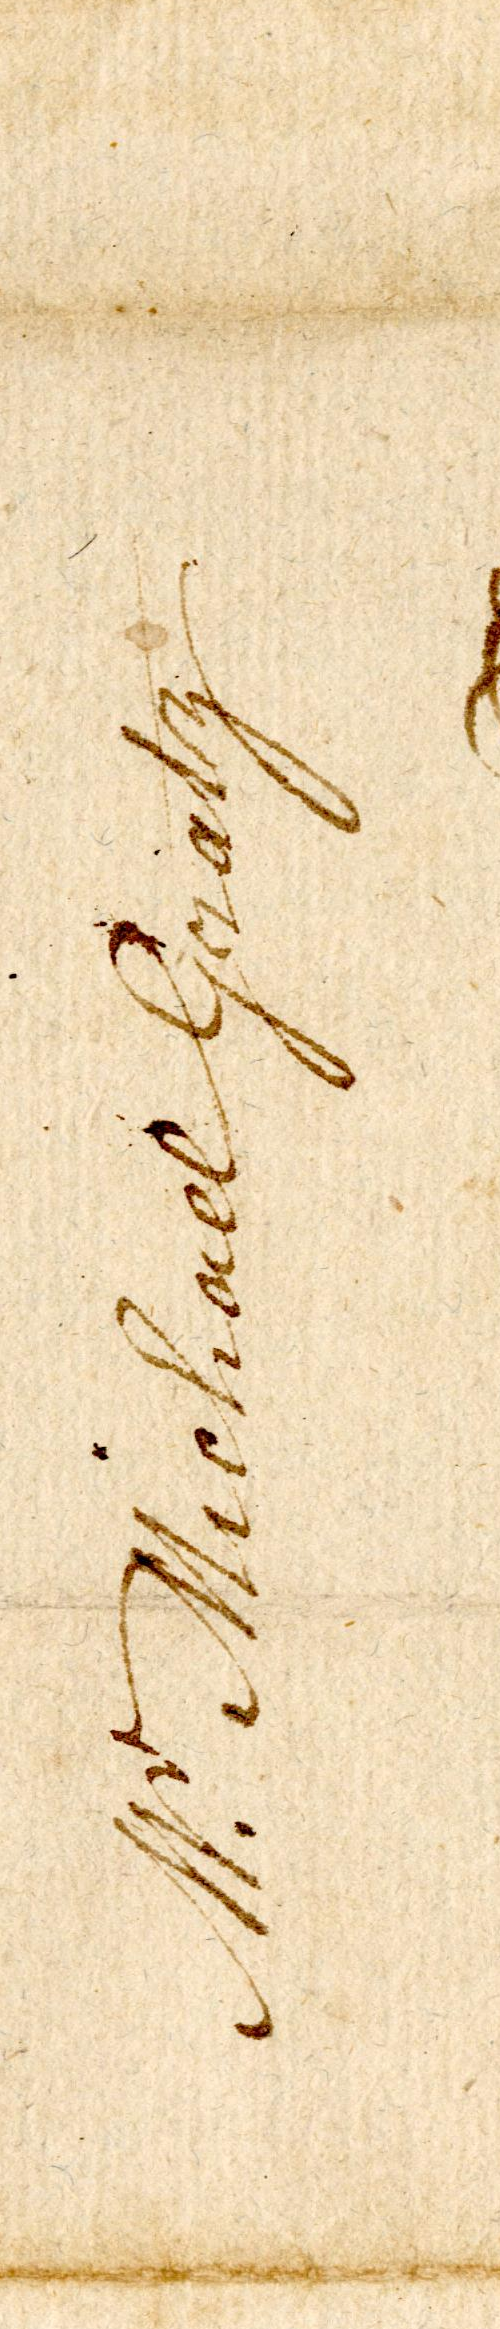M^r Michael Gratz
